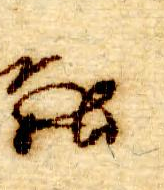old
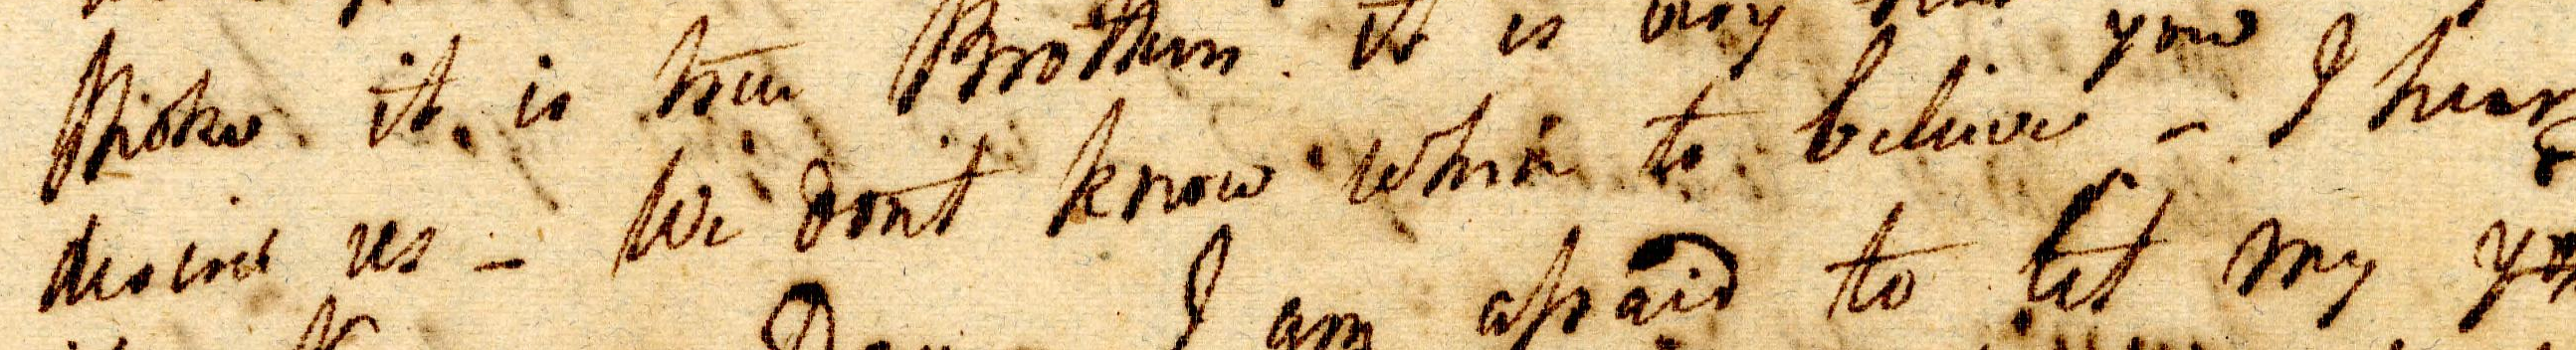desert us- We dont know what to believe- I hear
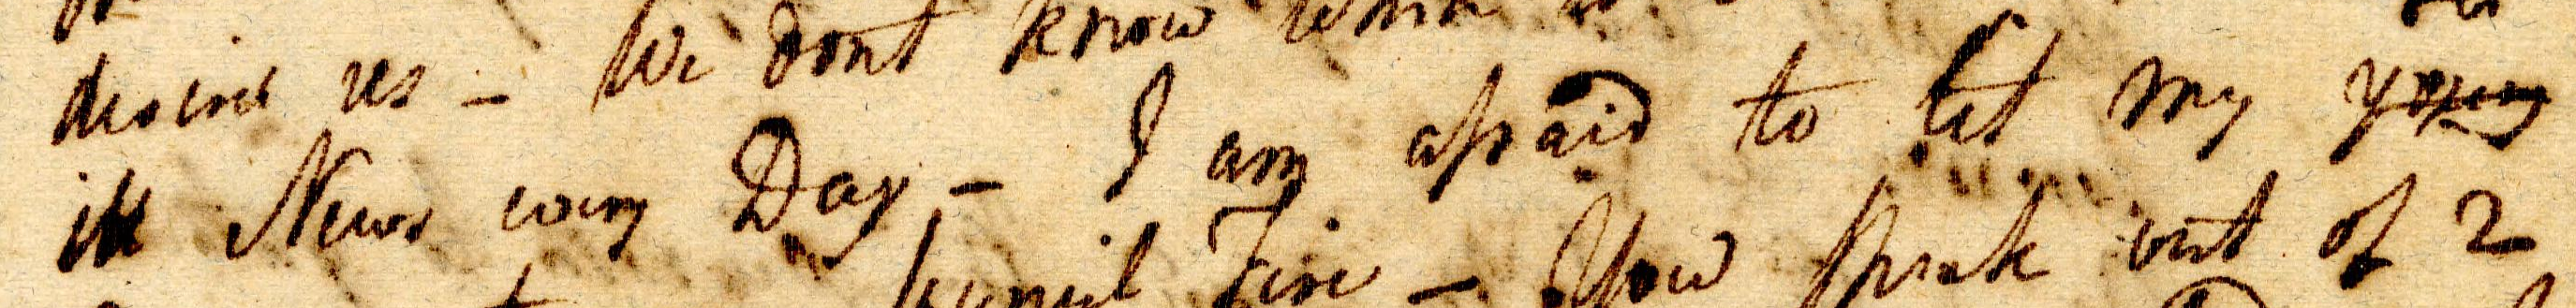ill News every Day- I am afraid to let my young
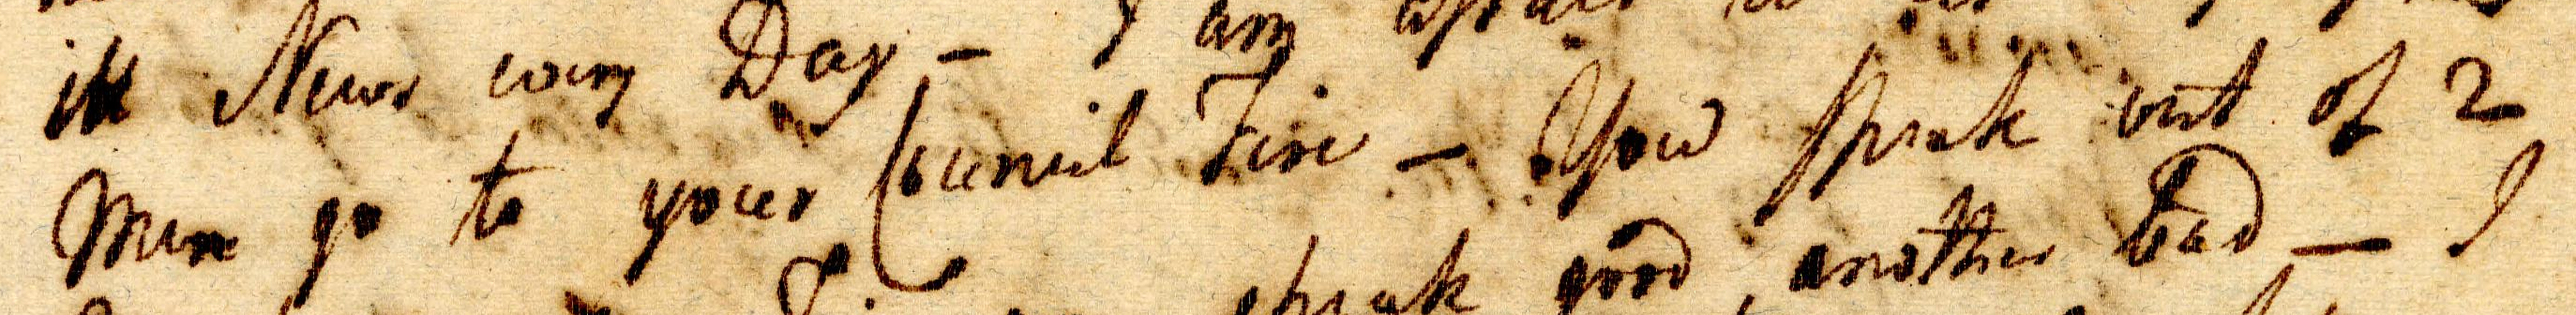men go to your Council Fire- You speak out of 2
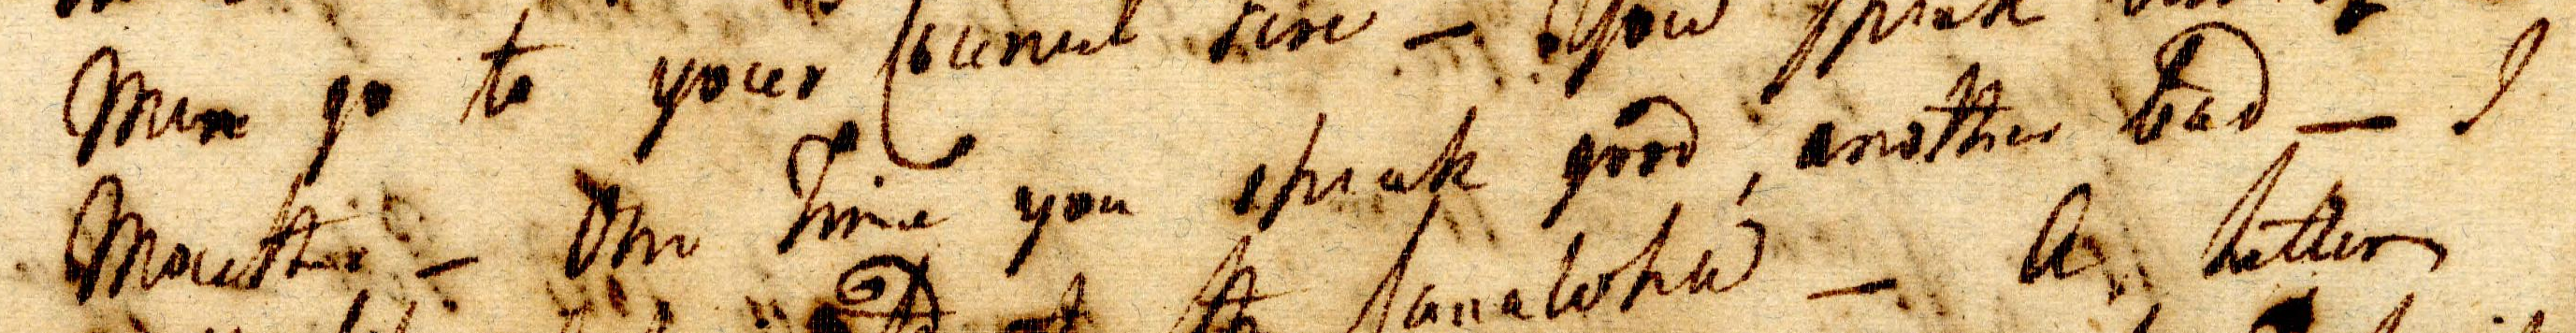Mouths- One Time you speak good, another bad- I
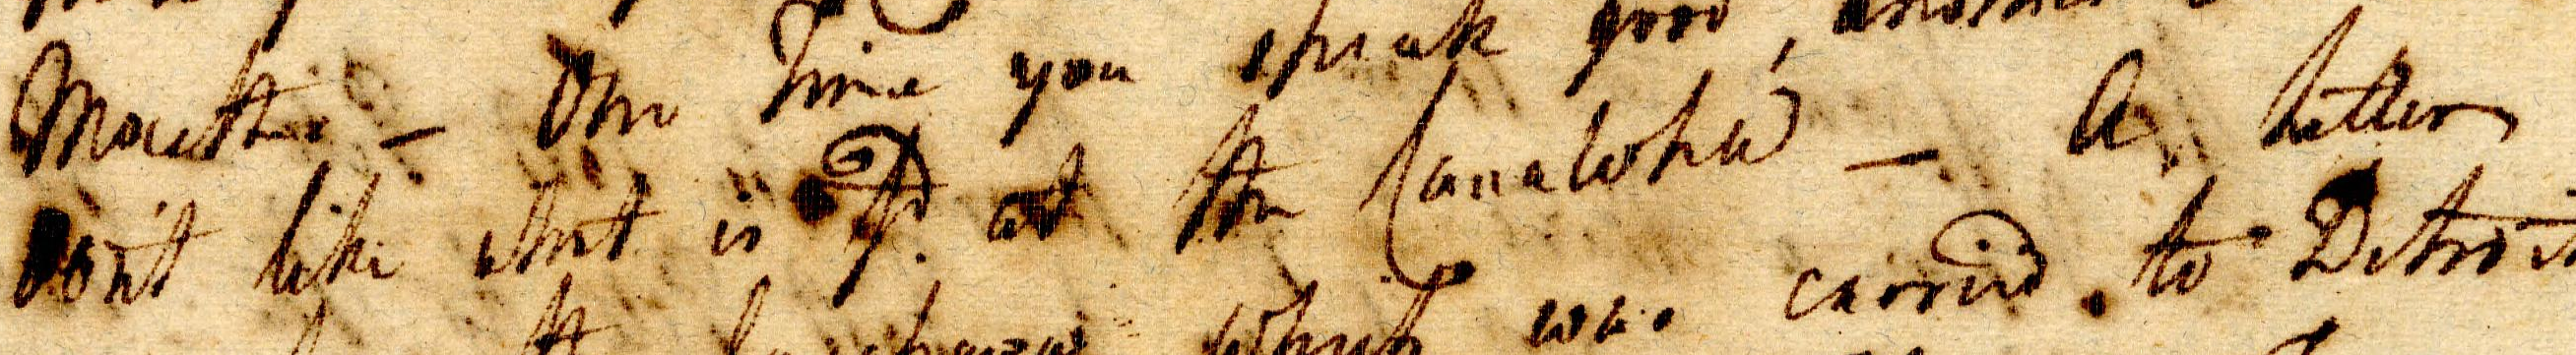don't like what is sd. at the Canawha- A letter
